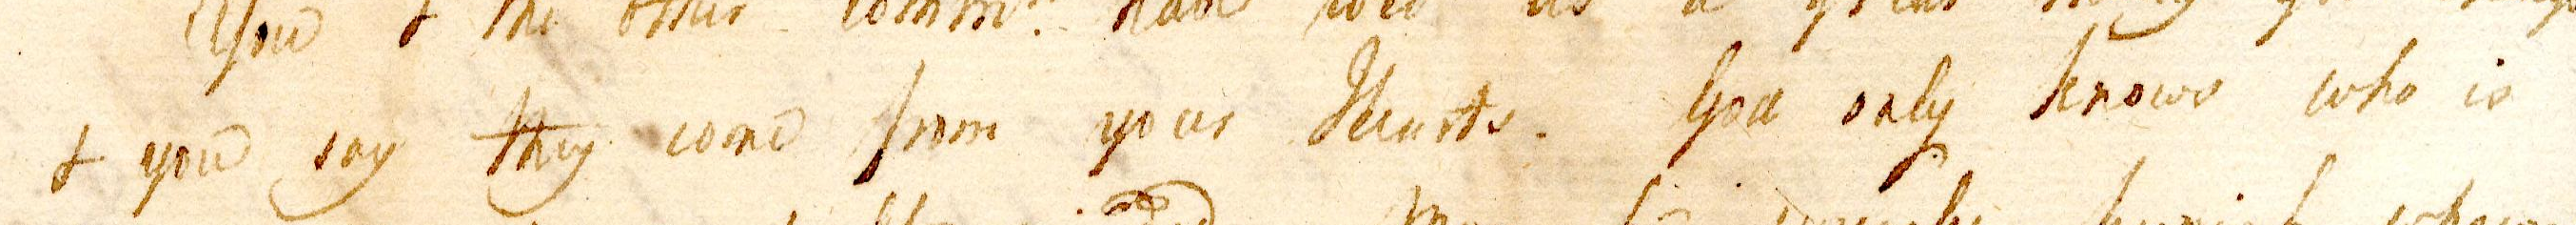& you say they come from your Hearts. God only knows who is
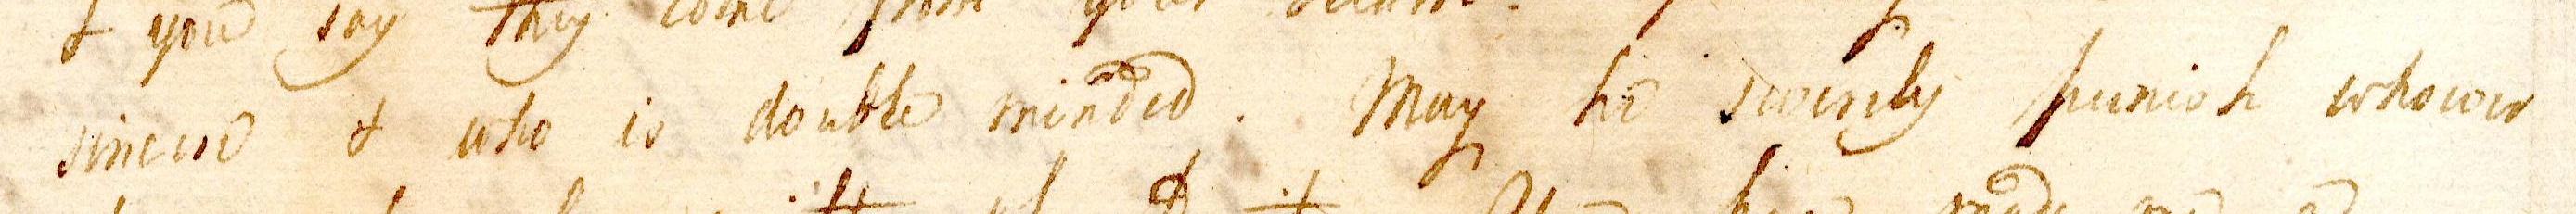sincere & who is double minded. May he severely punish whoever
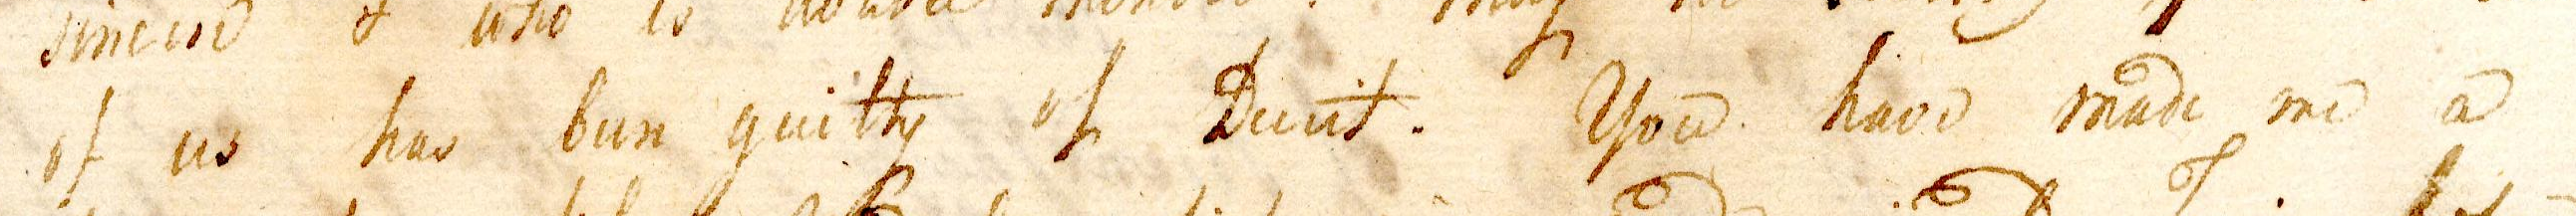of us has been guilty of Deceit. You have made me a
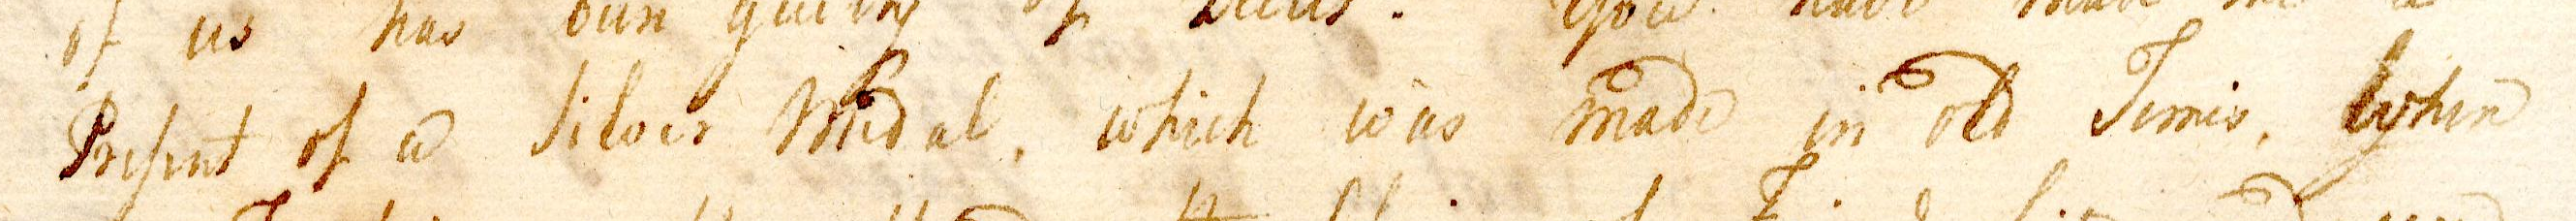Present of a Silver Medal, which was made in old Times, when
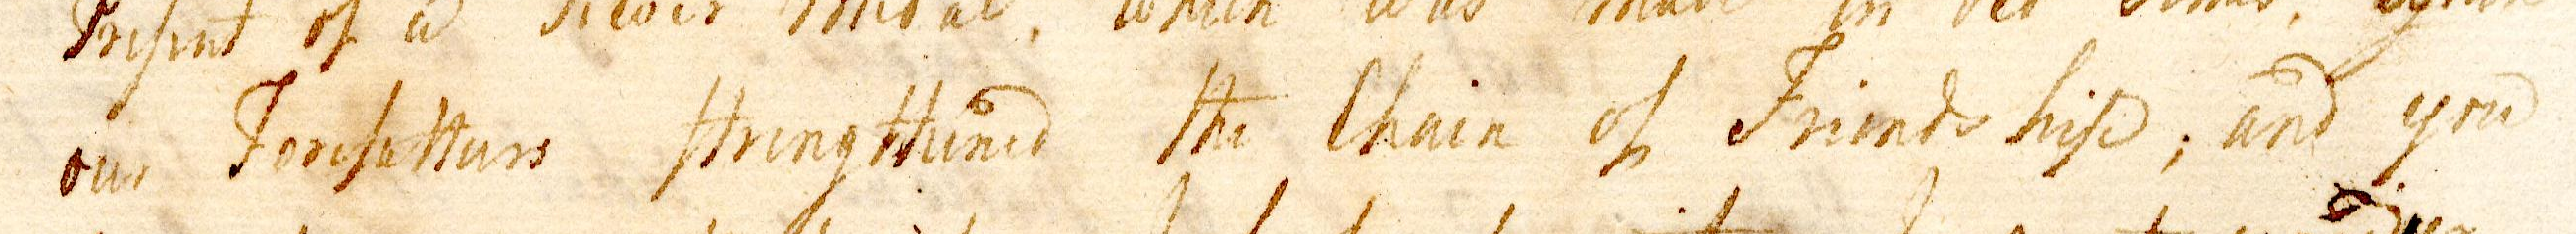our Forefathers strengthened the Chain of Friendship; and you
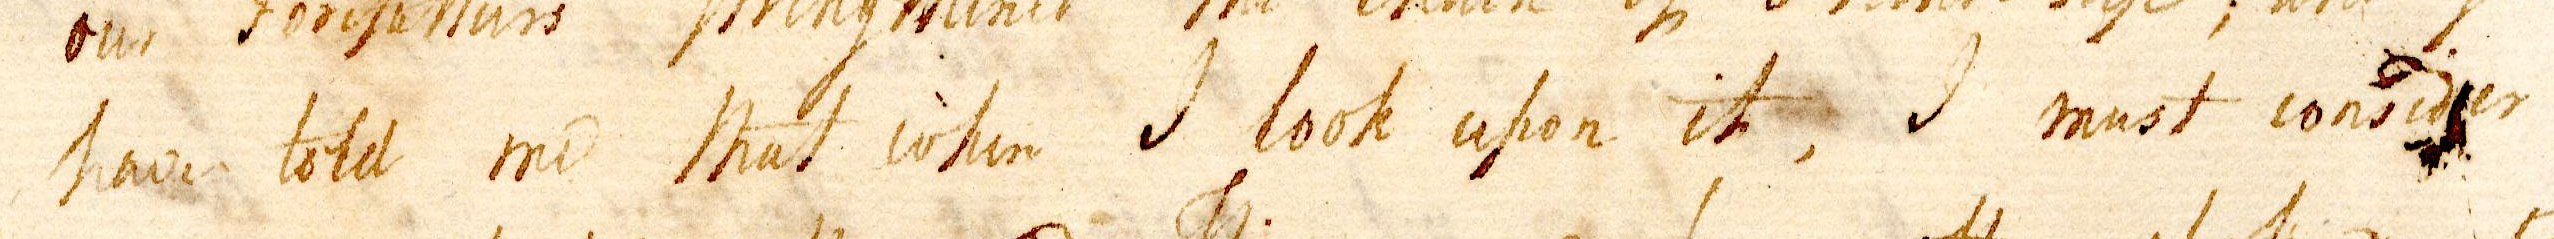have told me that when I look upon it, I must consider
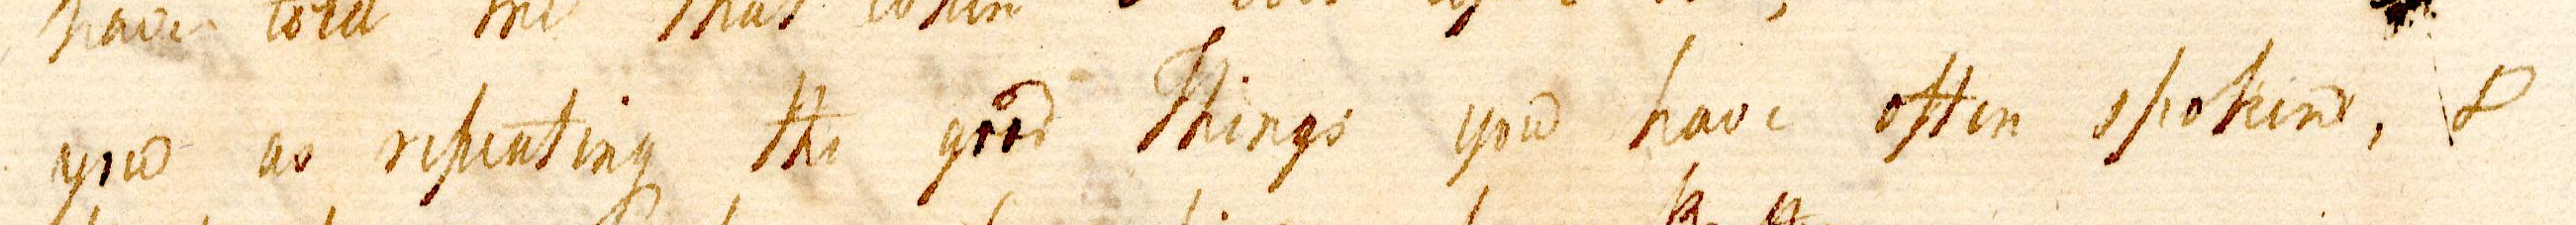you as repeating the good things you have often spoken, &
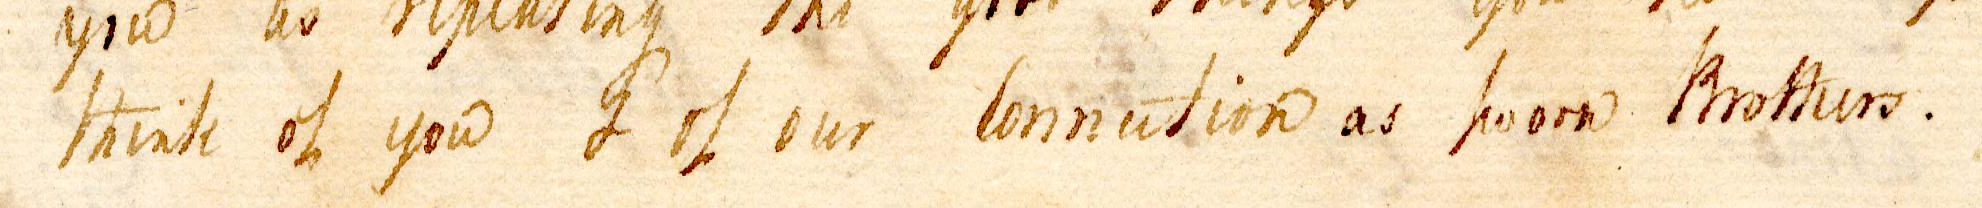think of you & of our Connection as sworn Brothers.
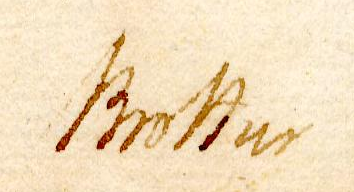Brother
